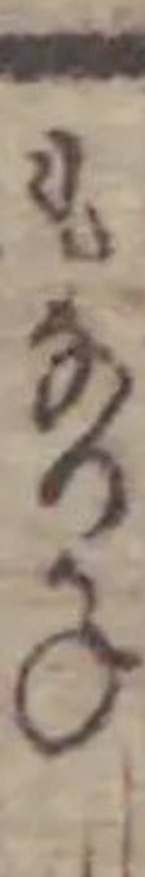もなりかね
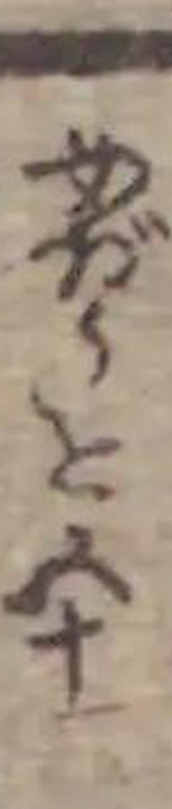女ぼうを五十
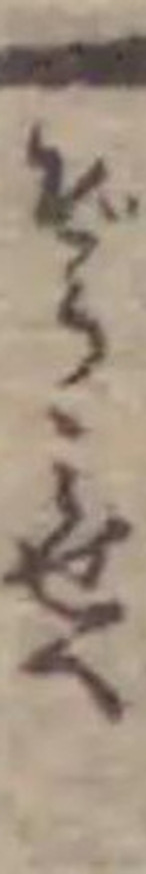ぞうみせへ
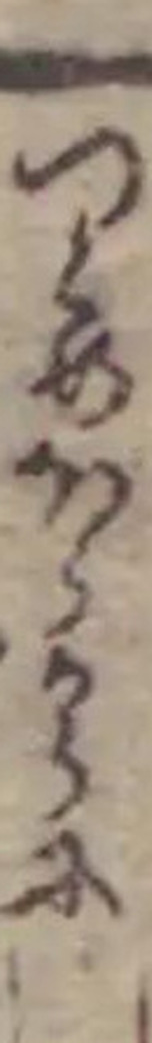つとめほうかうに
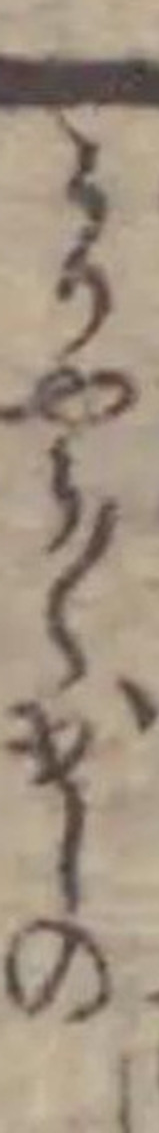うりやう〳〵かしの
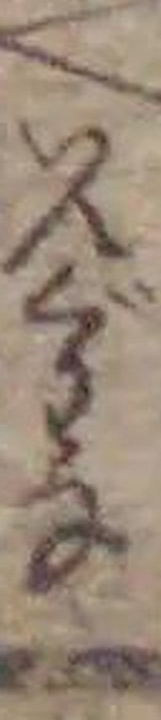いんぐわな
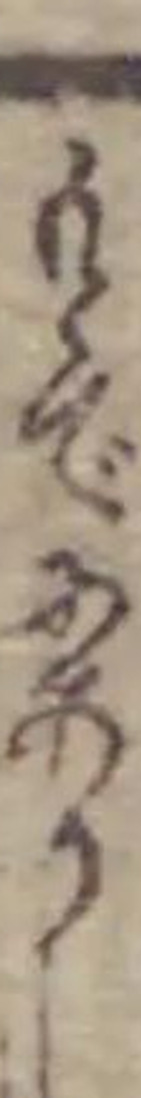もとでにあり
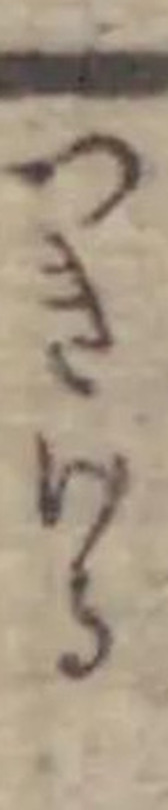つきける
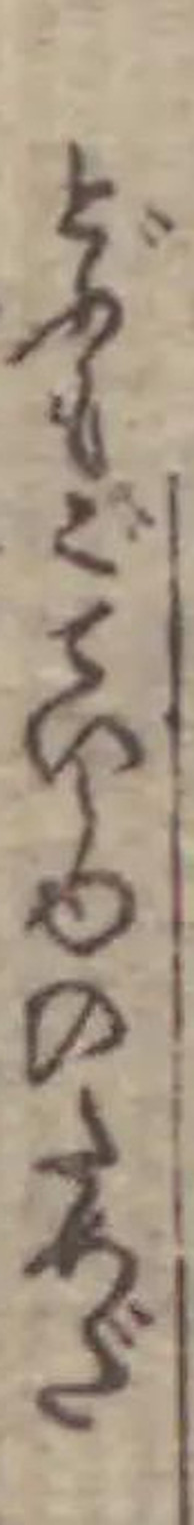どふもごていしゆのためだ
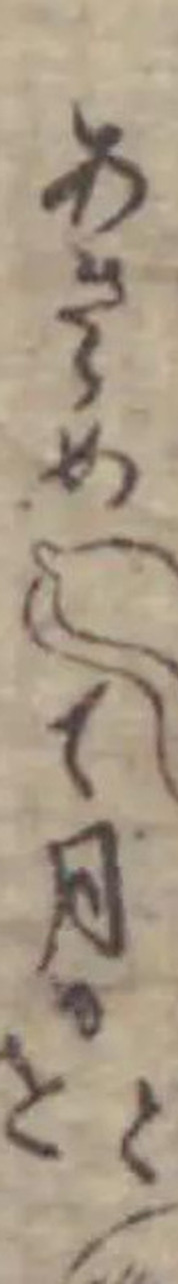あきらめて月日を
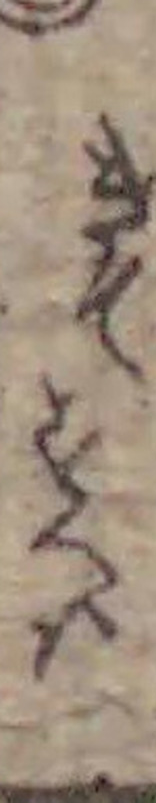きてすへは
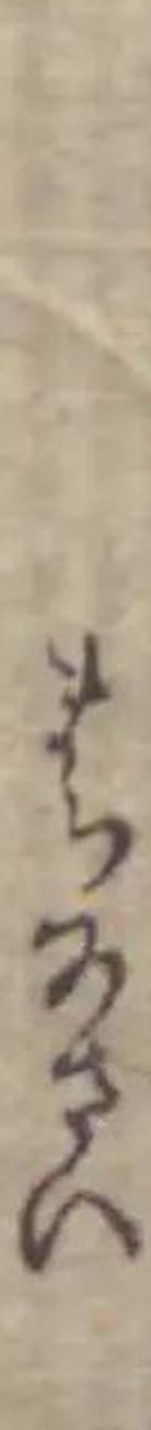まちなさい
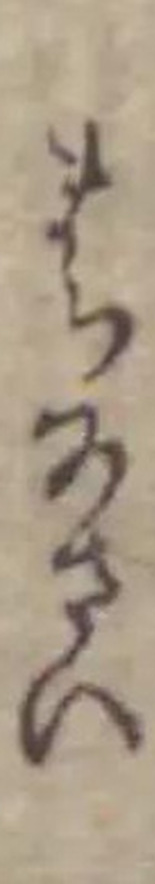まちなさい
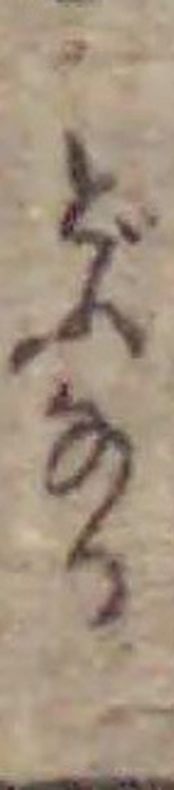どふなり
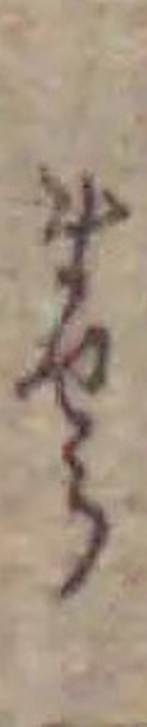ませう
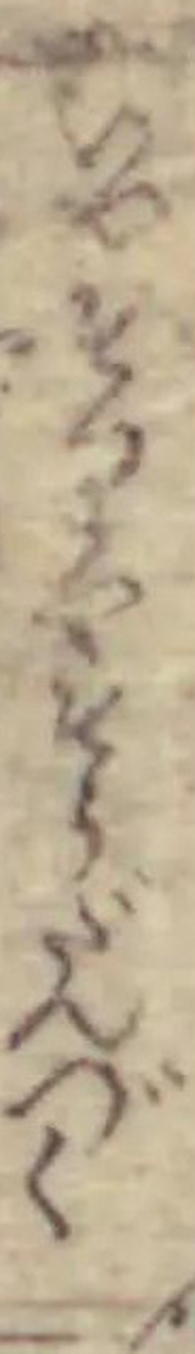いやそつちやそうだんづく
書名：奥州咄 3巻
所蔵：国立国会図書館 National Diet Library, JAPAN
